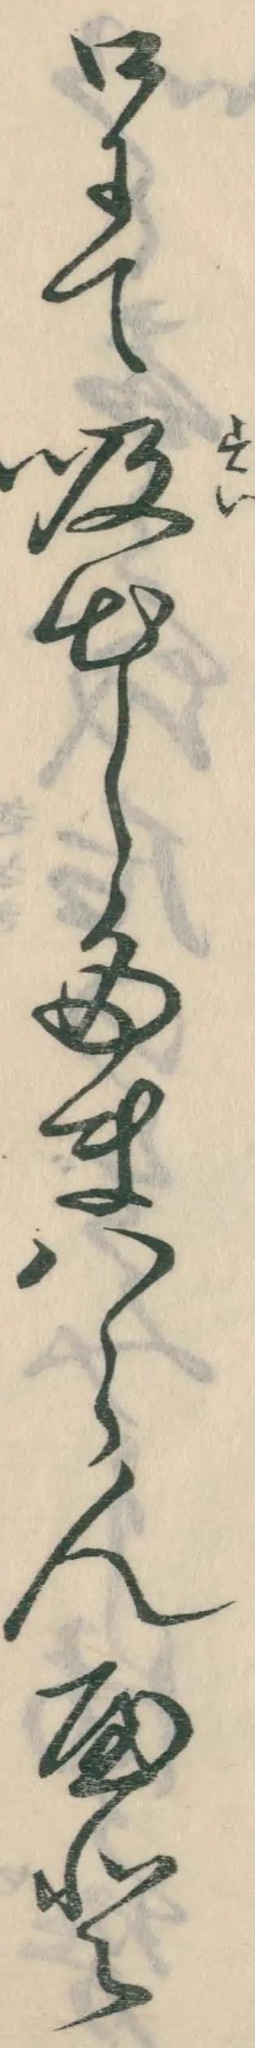口にて吸出したまはらんやと

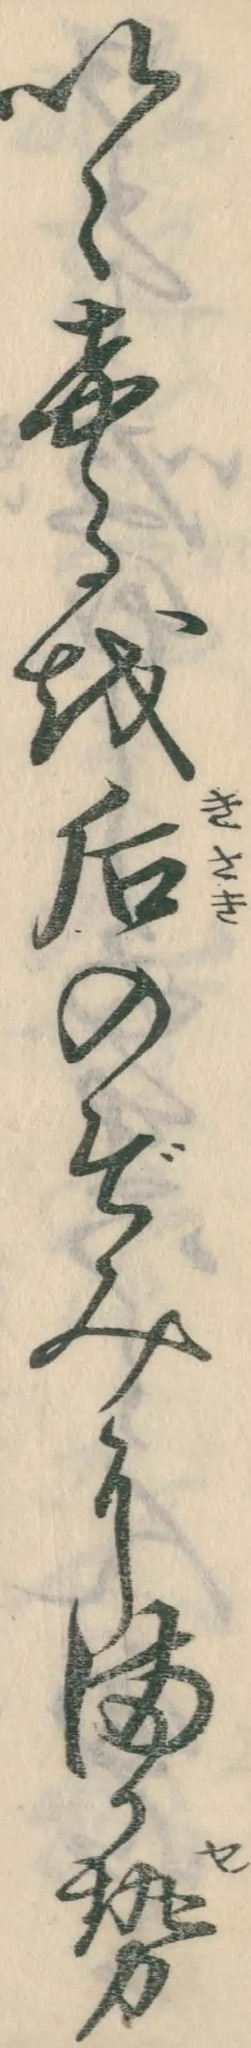いゝけるを后のぞみにまか勢
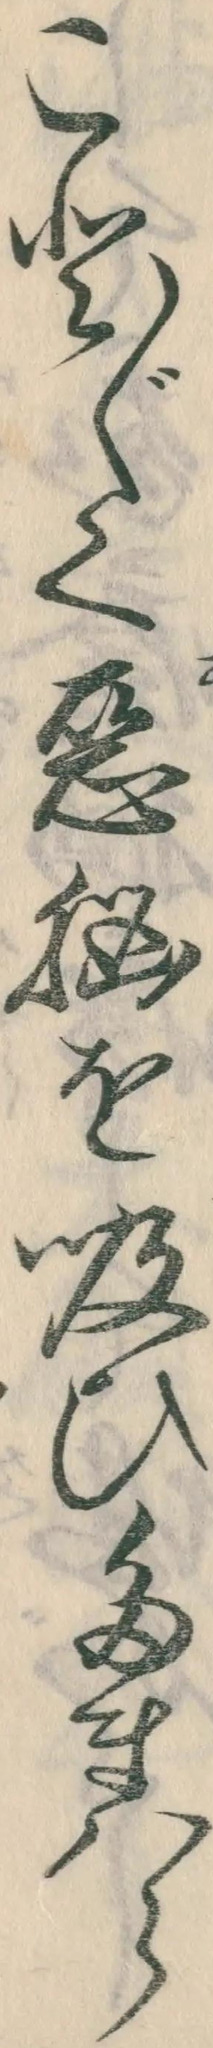こと〴〵く悪脳を吸ひたまはら
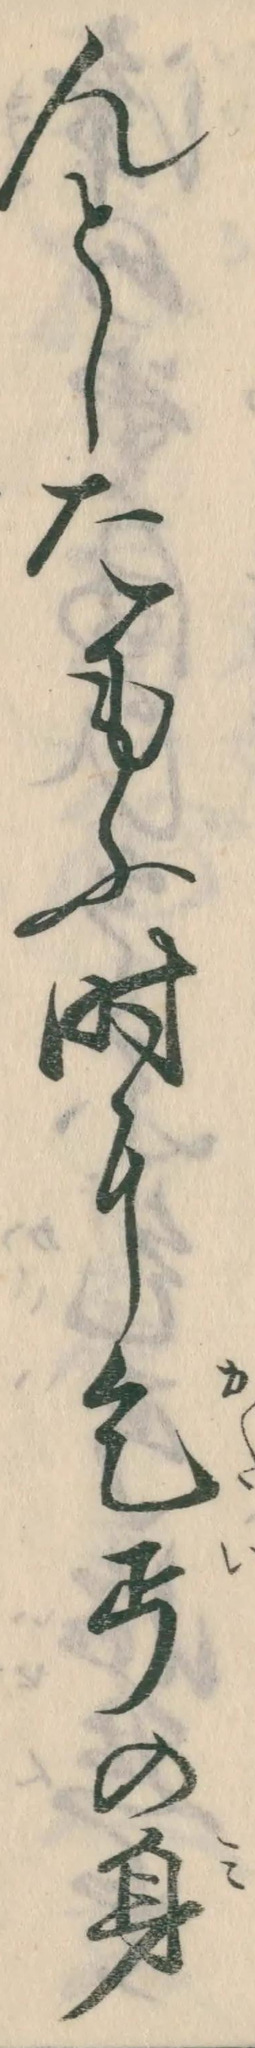んとしたもふ時に乞丐の身
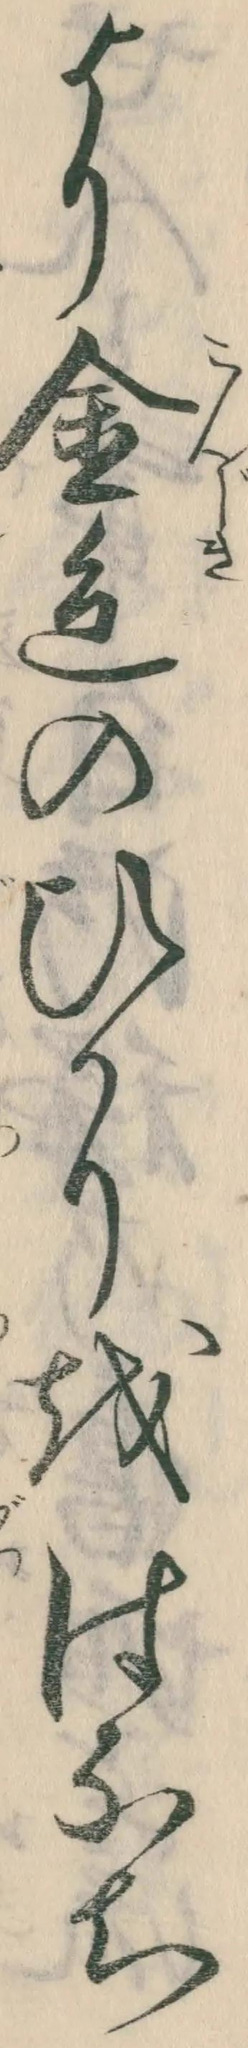より金色のひかりをはなち
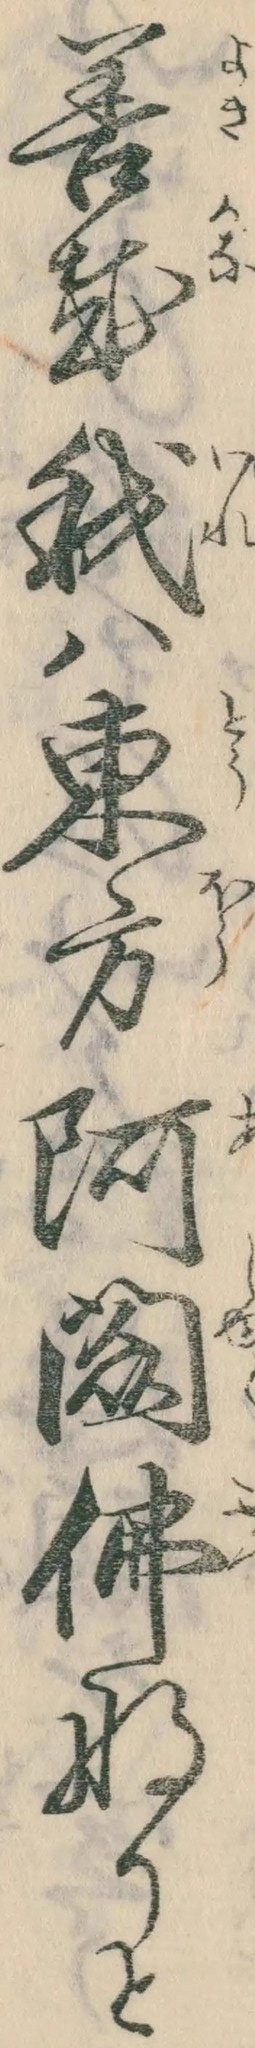善哉我は東方阿閦仏なりと
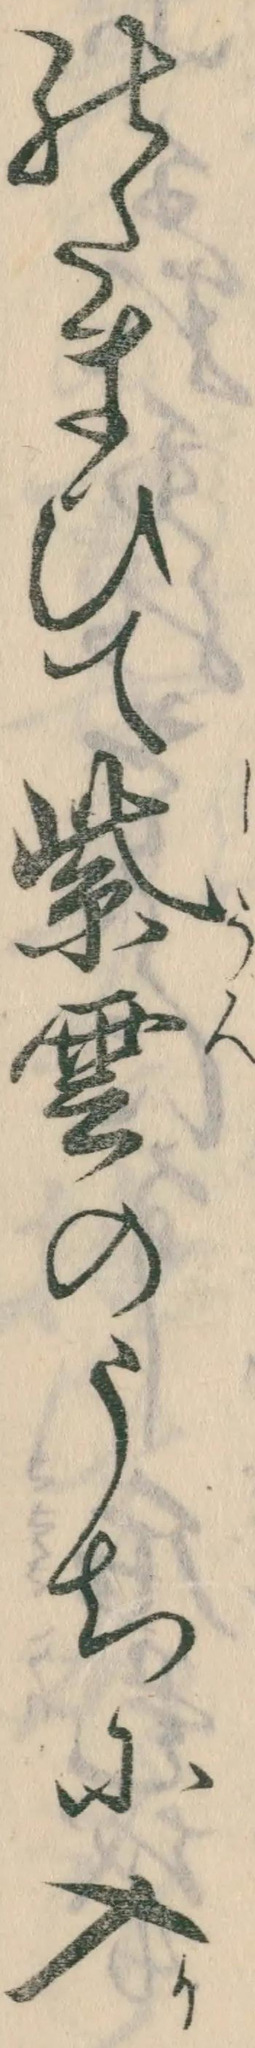のたまひて紫雲のうちに入り
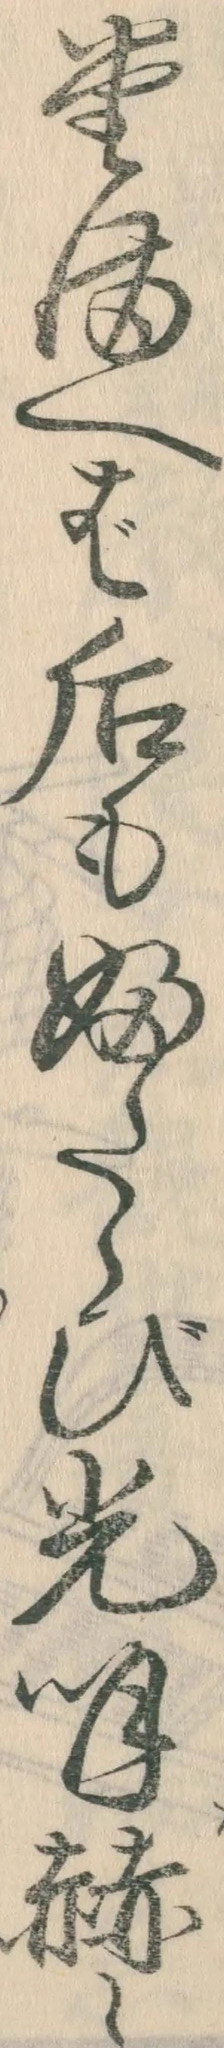たまへば后もふたゝび光明赫々
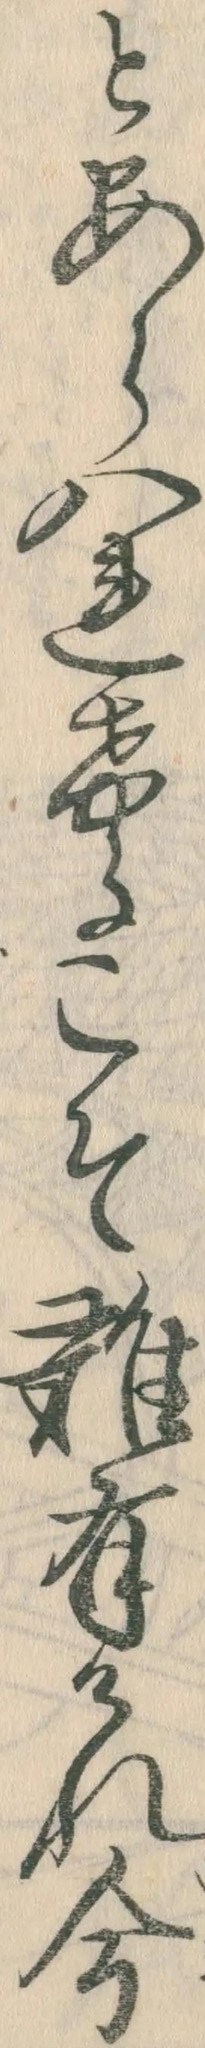とあらはれけるこそ難有けれ今
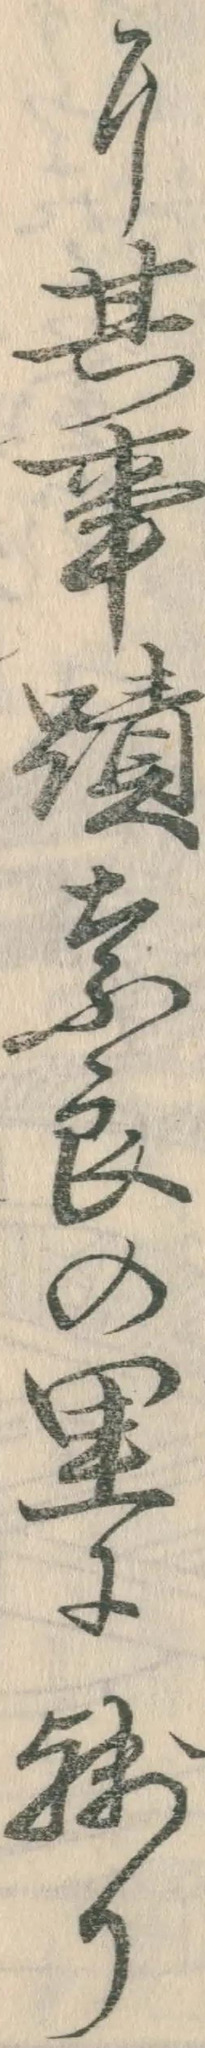に其事蹟奈良の里に残り
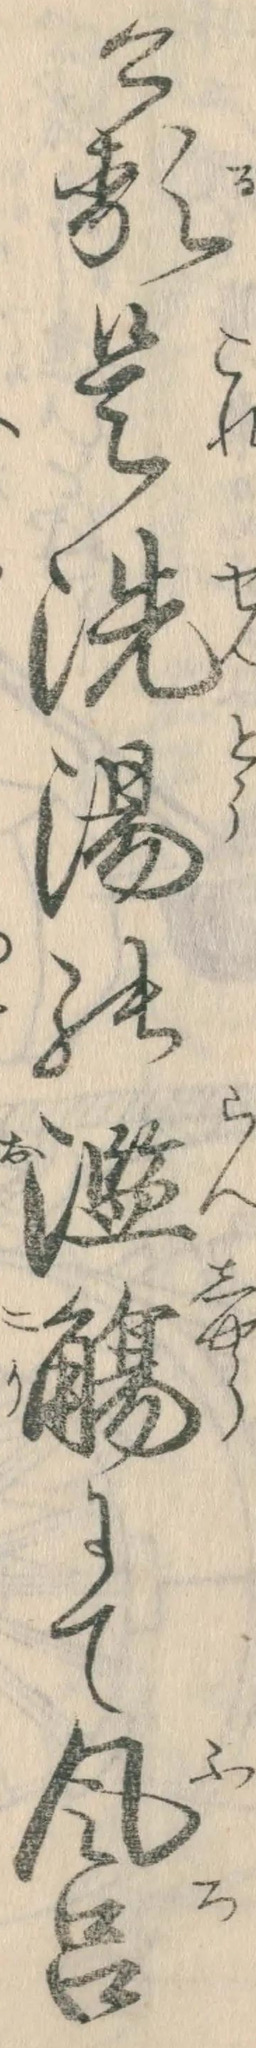け類是洗湯の濫觴にて風呂
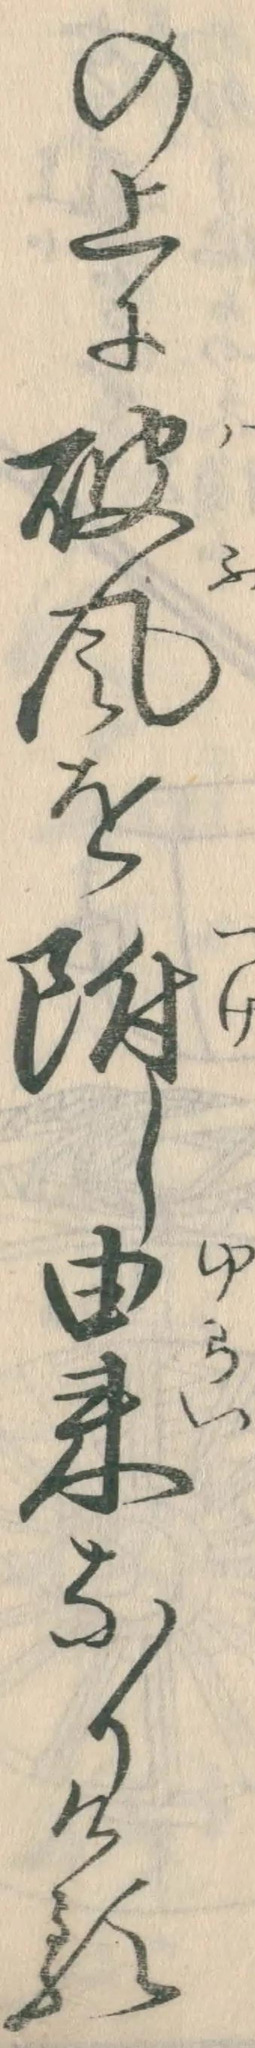の上に破風を付し由来なりける

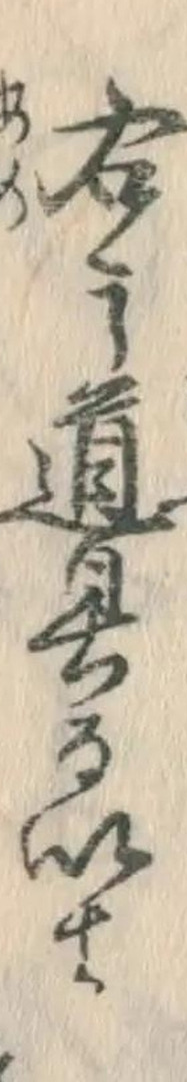右之道具るいは
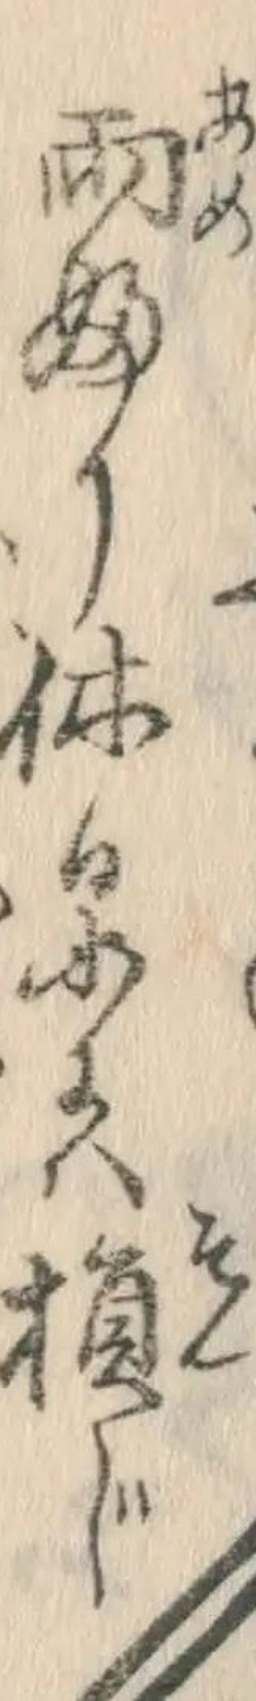雨ふり休日等には損じ
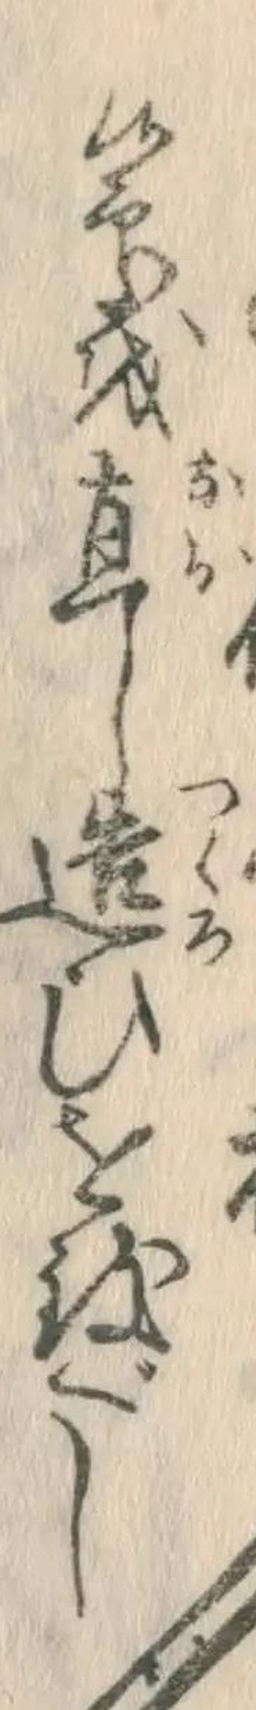候処を直し造ひを致べし
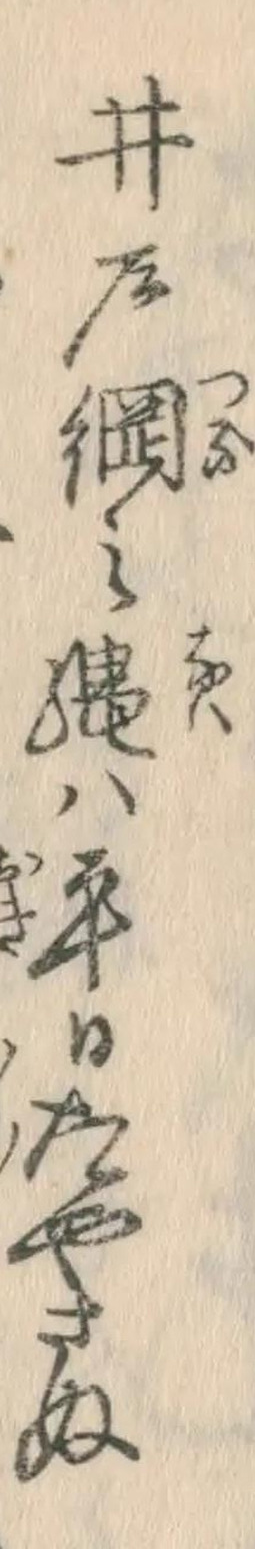井戸綱之縄は平日たやさぬ
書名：洗湯手引草
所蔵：国立国会図書館 National Diet Library, JAPAN
